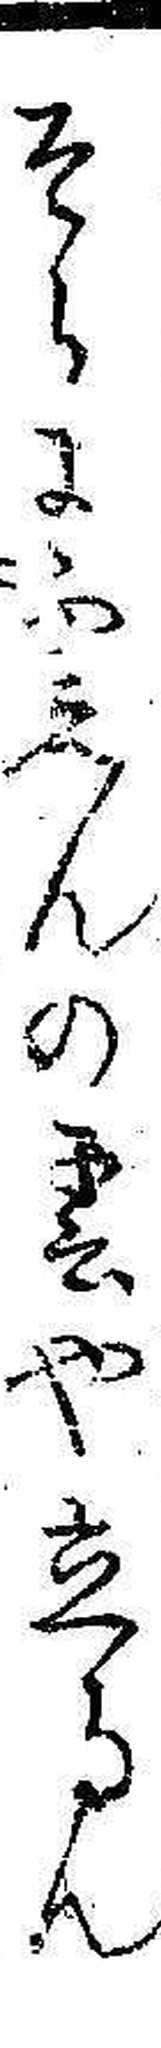そらにやしんの雲や立らん
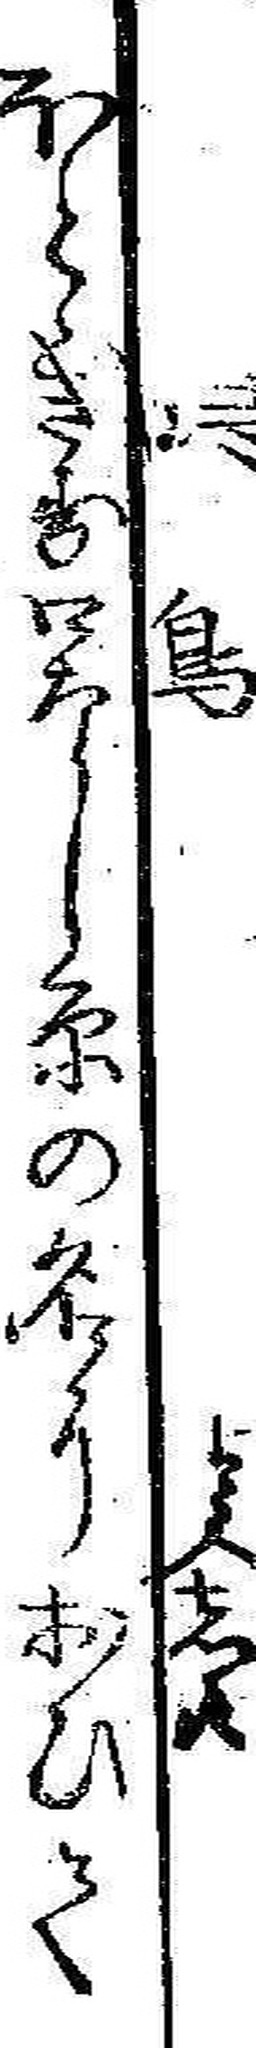ほととぎす口なし原の名かりおひて
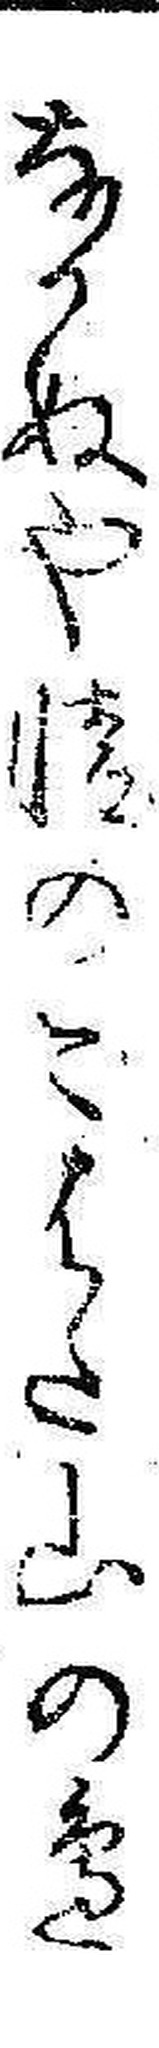なかぬやのこはた山の辺
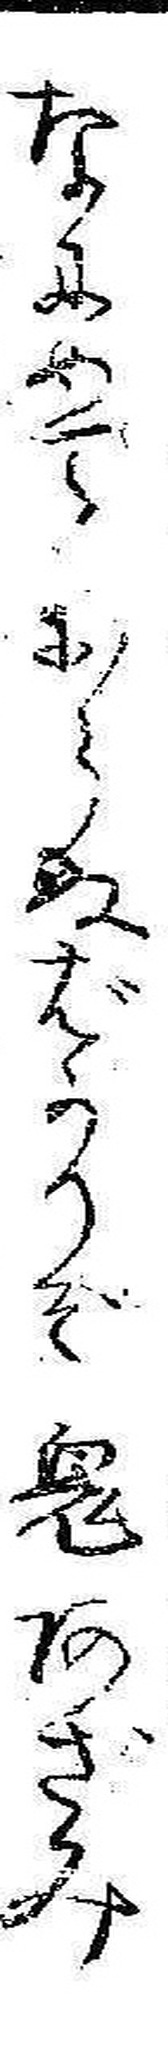なにめてゝおらぬばかりぞ鬼あざみ
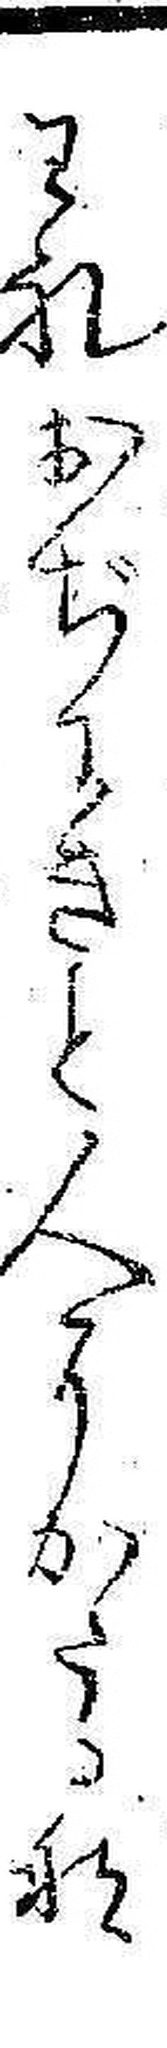われおぢにきと人にかたるな
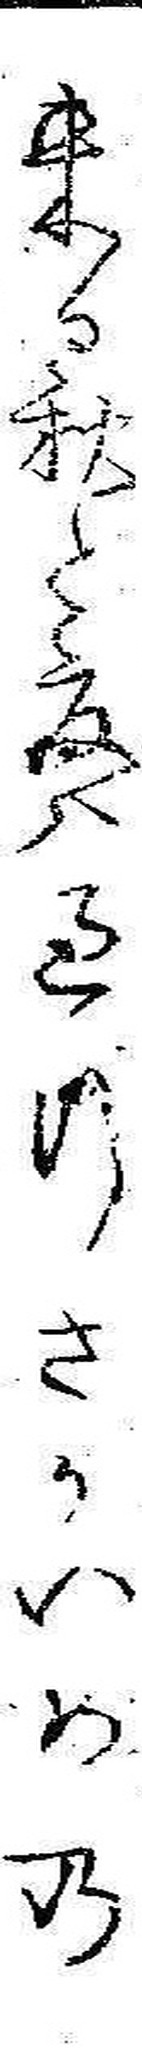来る秋と夏はさかいめの
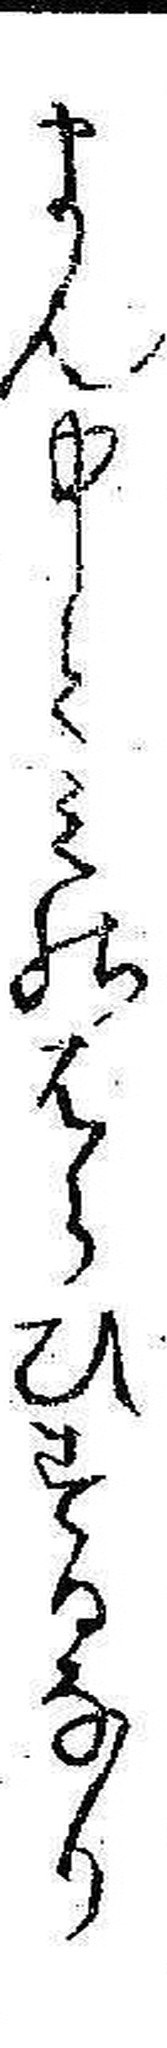んとみのはらひするなり
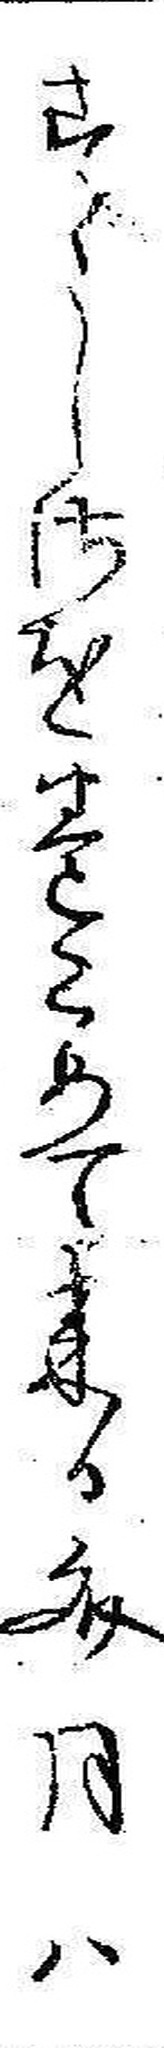すゞしさを巻とめて来る文月は

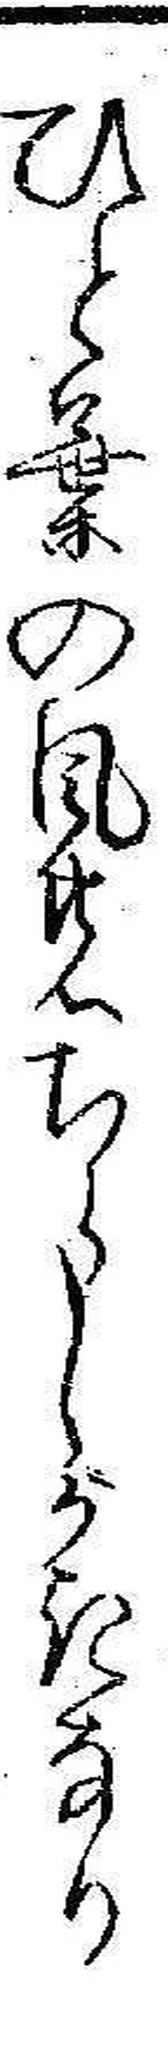ひと葉の風のちらしかたなり
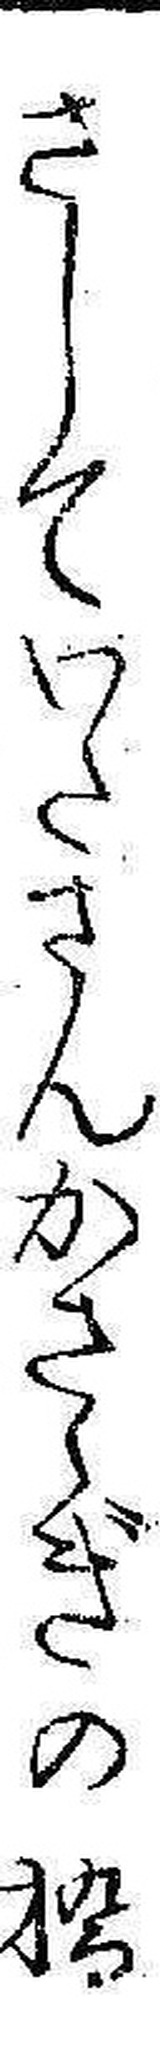さしてわたさんかさゝぎの橋
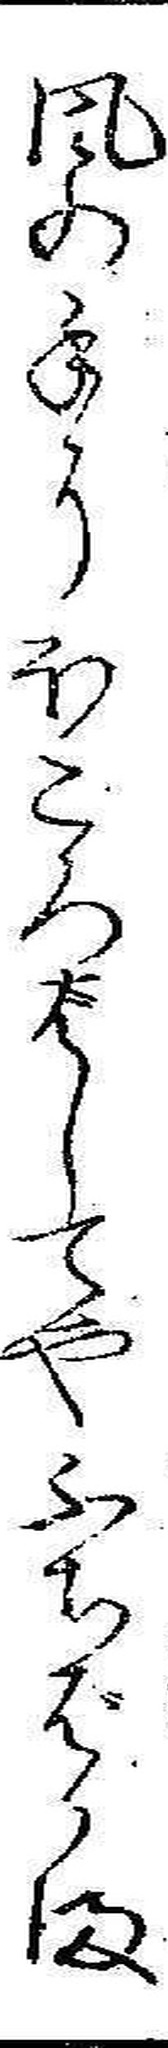風の手にほころばしてやふちばかま
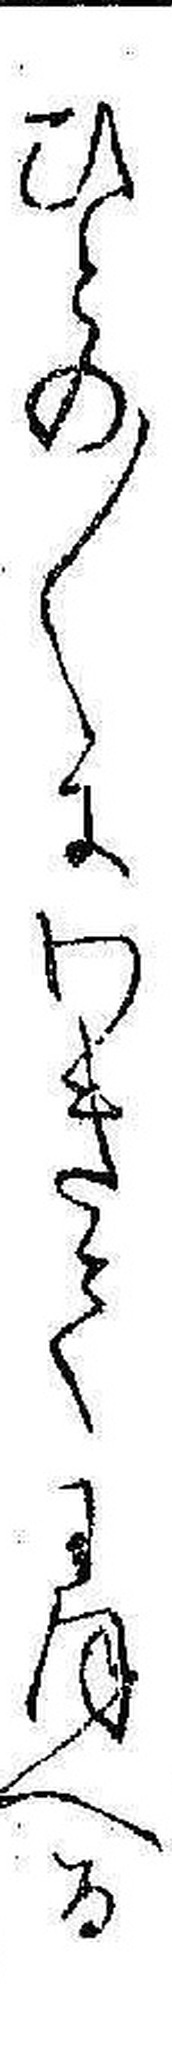ひとの〳〵にわきてにほへる
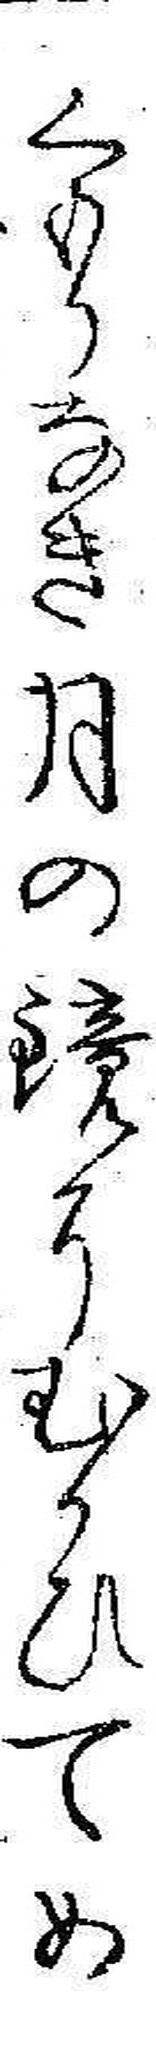くもりなき月のにむかひて
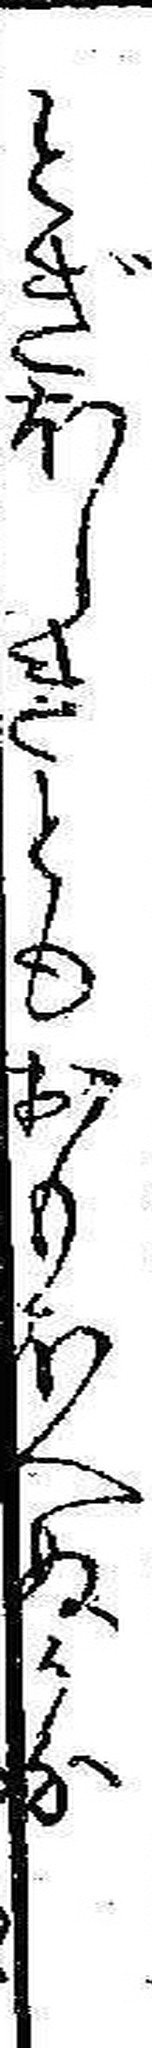とぎほしともおもほへぬかな
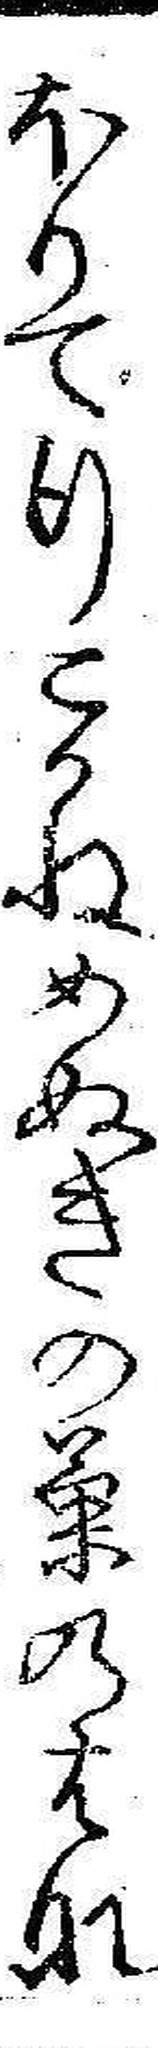ほりて行こかねめぬきの菊のはな
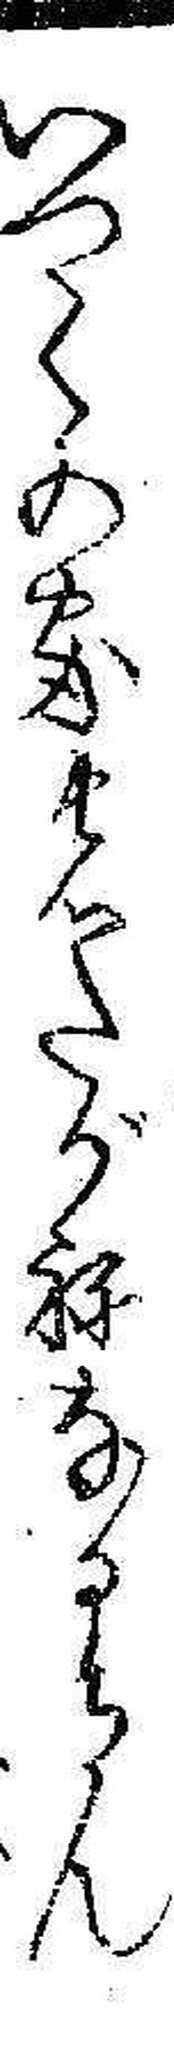いつくのたがねなるらん
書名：狂哥はまのきさご
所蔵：国文学研究資料館
